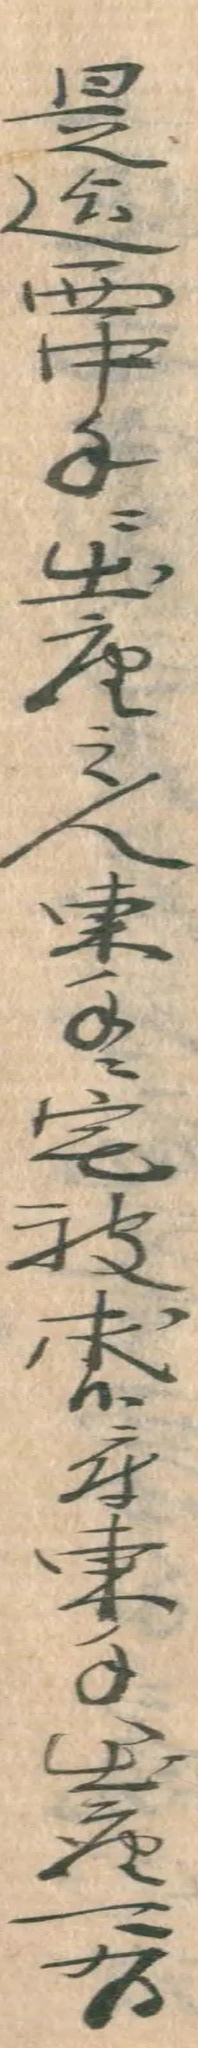一是迄西中手ニ出座之人東手ニ宅被求候ニ付東手ヘ出座可有
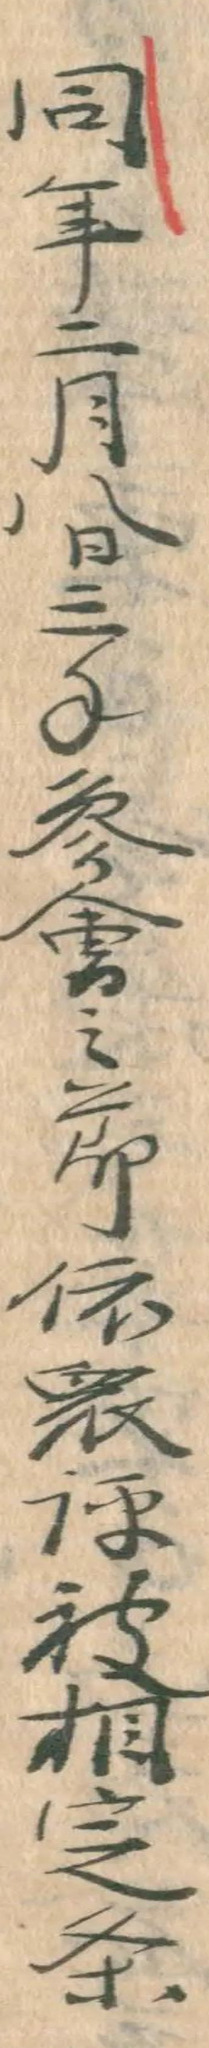同年二月八日三手参會之節依衆評被相定条
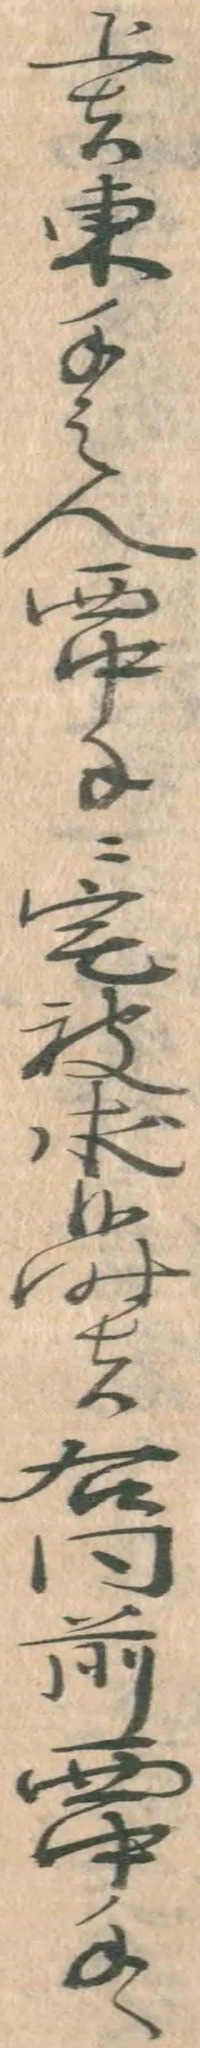上は東手之人西中手ニ宅被求候時は右同前西中の手へ
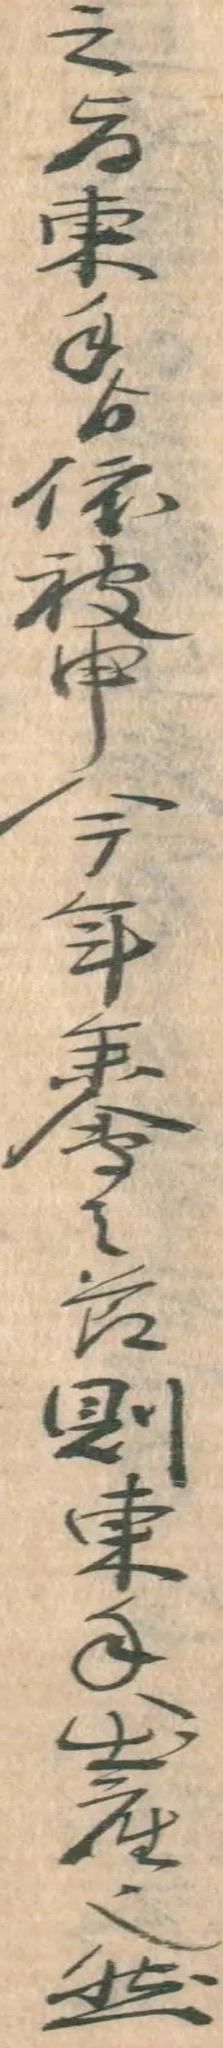之旨東手ゟ依被申今年参會之節則東手へ出座也然
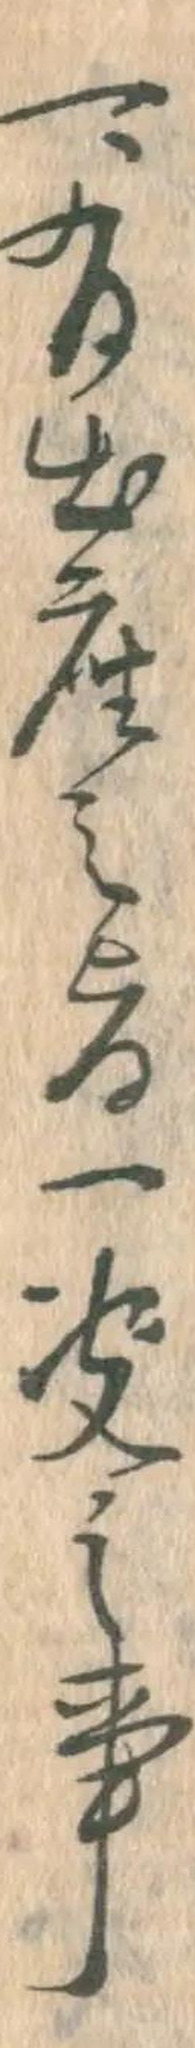可有出座之旨一決之事
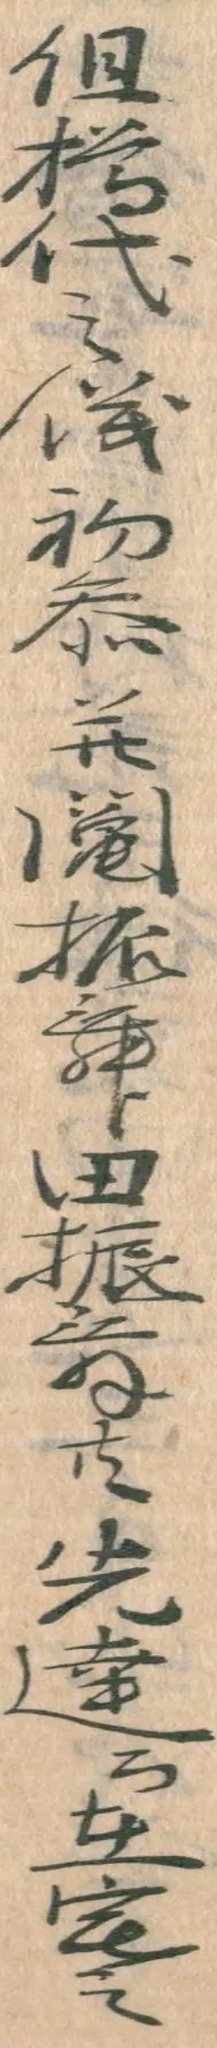但樽代之儀初参并鬮振舞田振舞共先達而在宅之
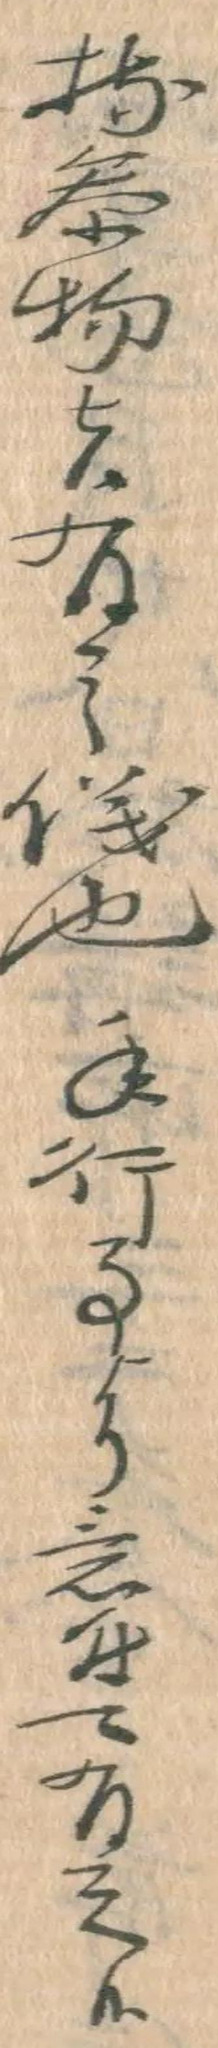持参物は有之儀也年行事より意付可有之候
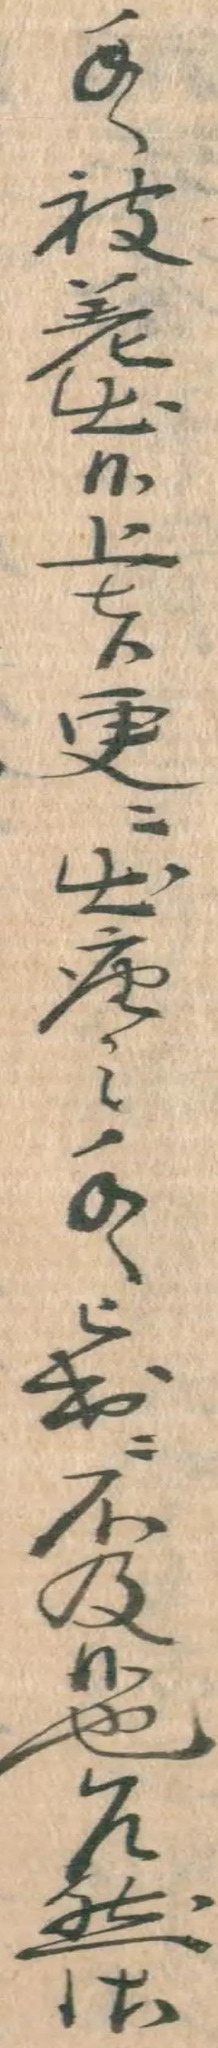手へ被差出候上は更に出座之手へ出に不及候也乍然御
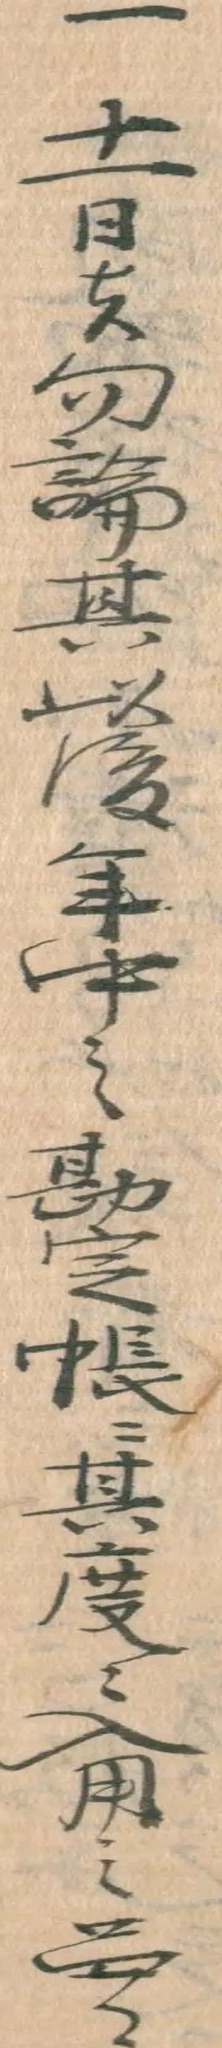一十一日は勿論其以後年中之勘定帳ニ其度々入用之品々
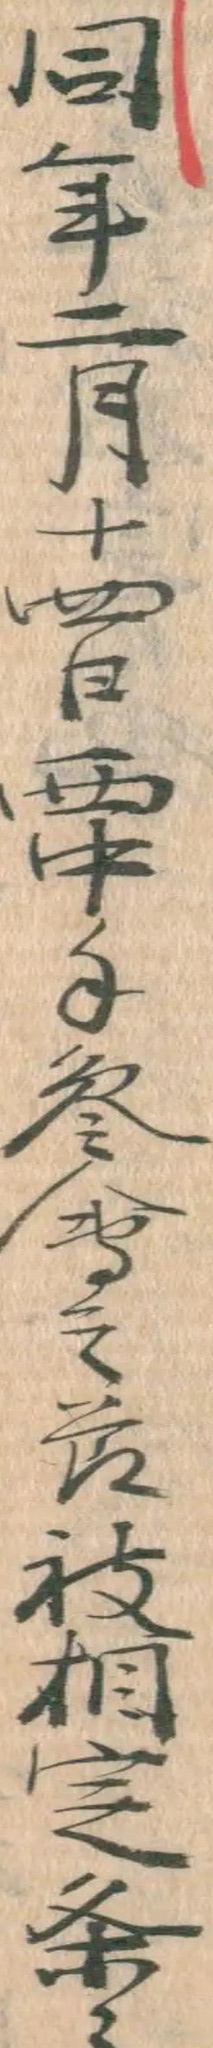同年二月十四日西中手参會之節被相定条々
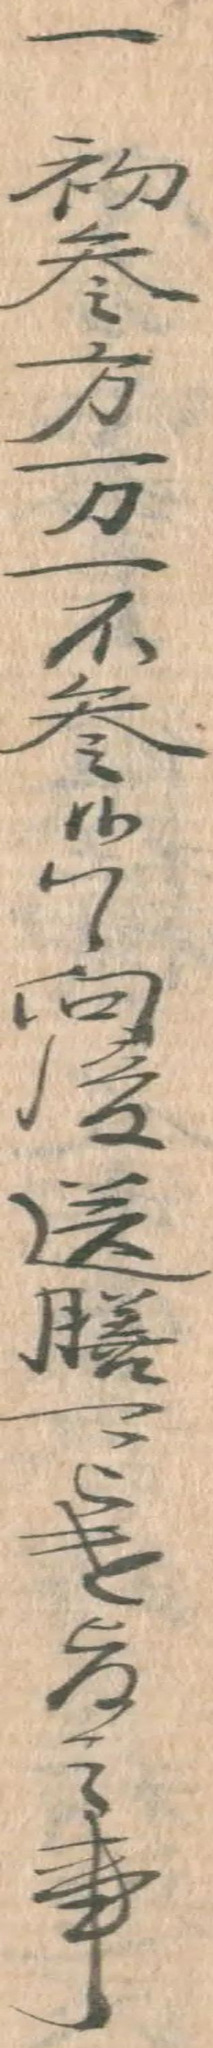一初参方万一不参候ハヽ向後送膳可被遣旨之事
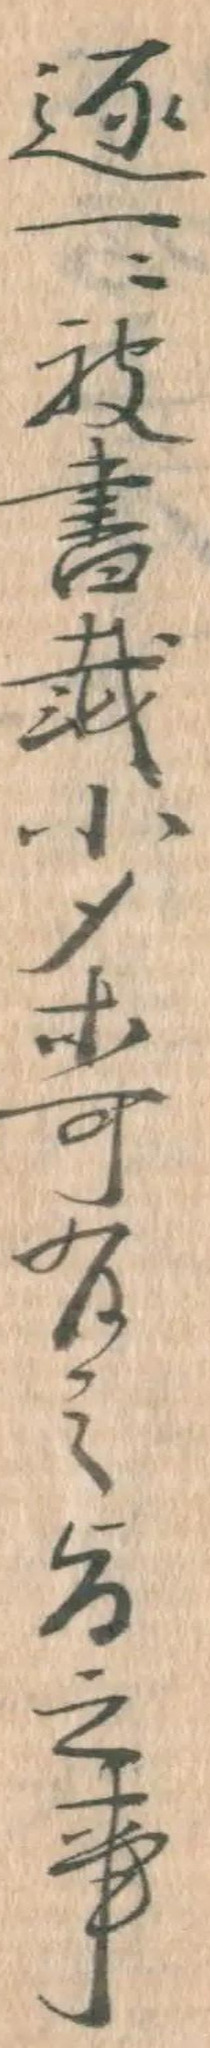逐一ニ被書載小〆等可有之旨之事
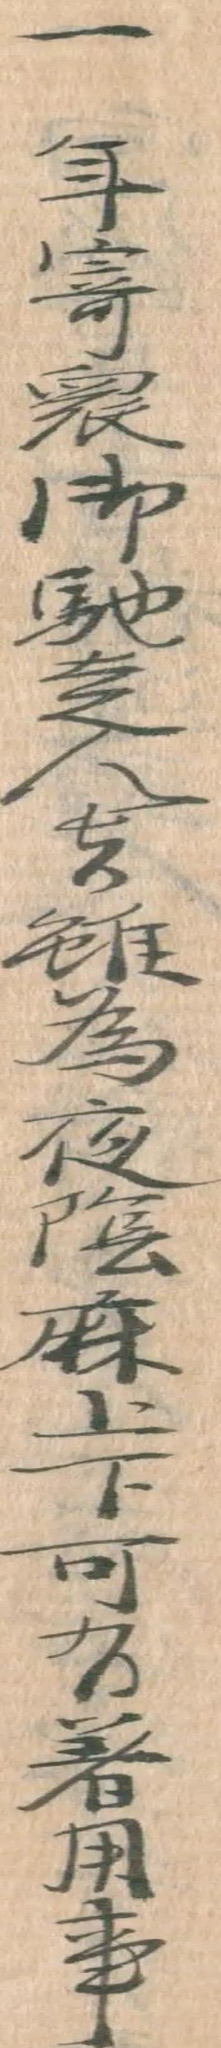一年寄衆御馳走人者雖為夜陰麻上下可有着用事
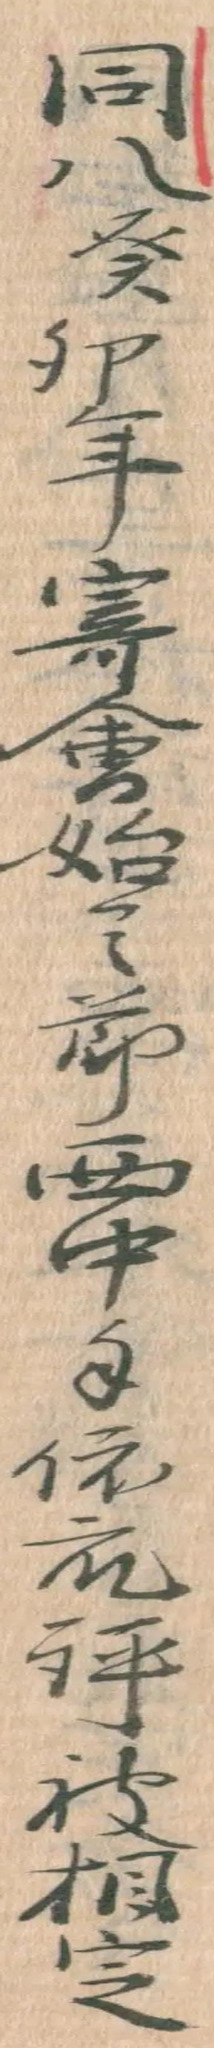同八癸卯年寄會始之節西中手依衆評被相定
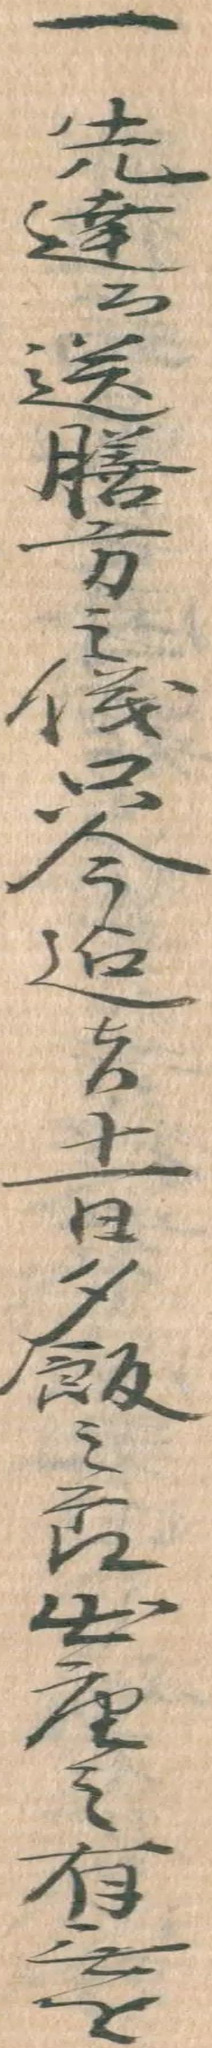一先達而送膳方之儀只今迄は十一日夕飯之節出座之有無を
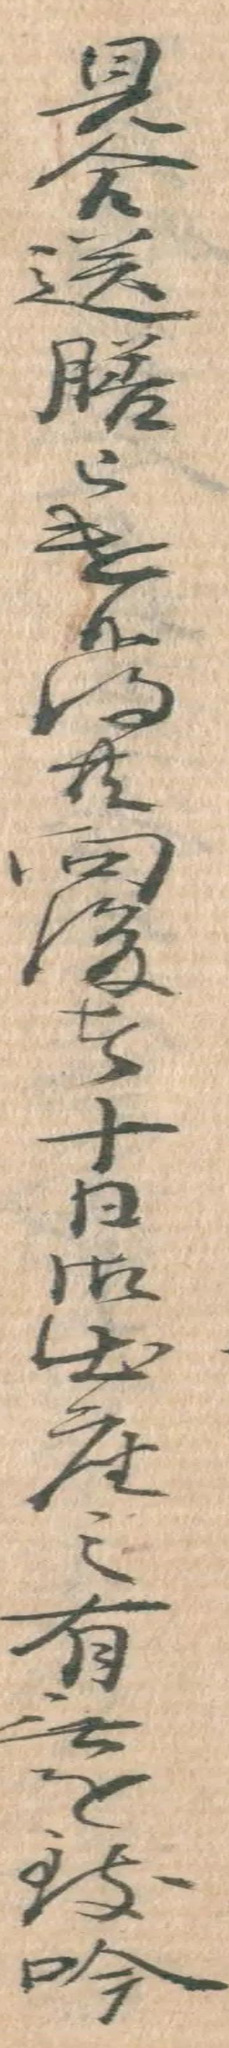見合送膳被遣候得共向後は十日御出座之有無を致吟
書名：賀茂社記録. 第29冊
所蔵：国立国会図書館 National Diet Library, JAPAN
